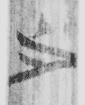之
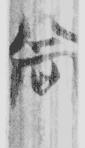尚
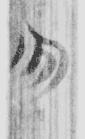勿
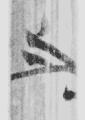之
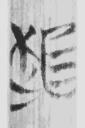𧻚
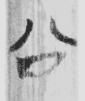公
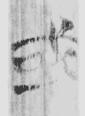或
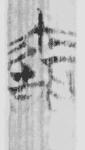{尒䎽}
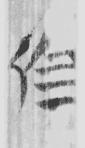於
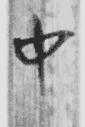中
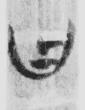曰
